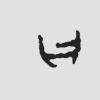曰
